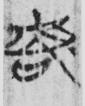若
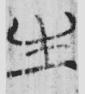生
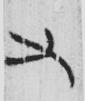又
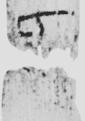耳
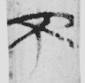不
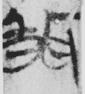䎽（聞）
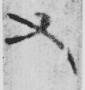又
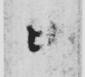口
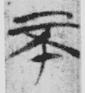不
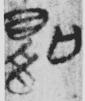鳴
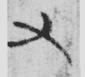又
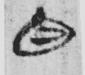目
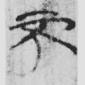不
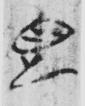見
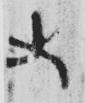又
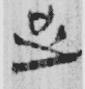足
